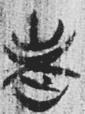老老
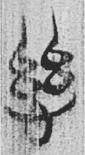慈
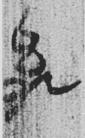幼
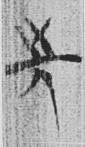先
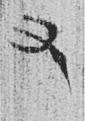又（有）
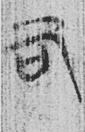司
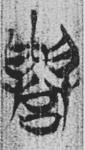○（舉）
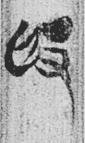○（賢）
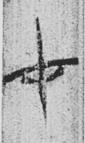才
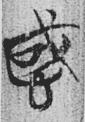惑（赦）
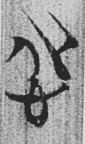○（過）
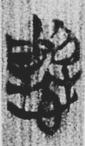○（與）
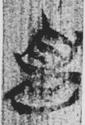辠（罪）
